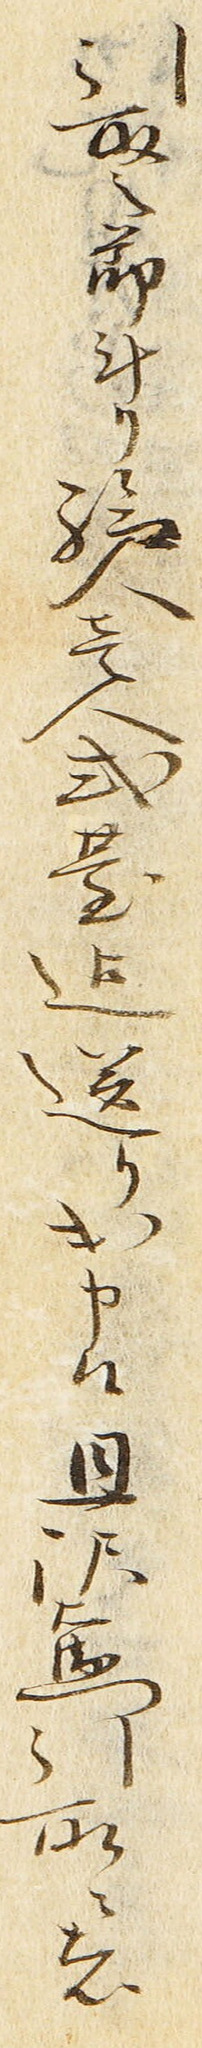引取之節斗りに給人壱人式台迠送り出申候且沢右衛門引取には
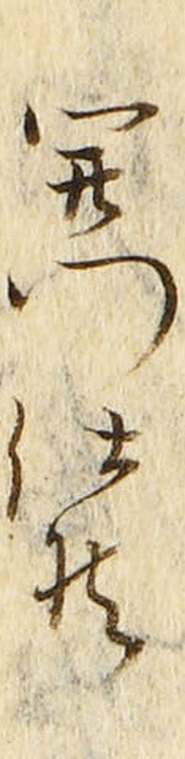開門仕候
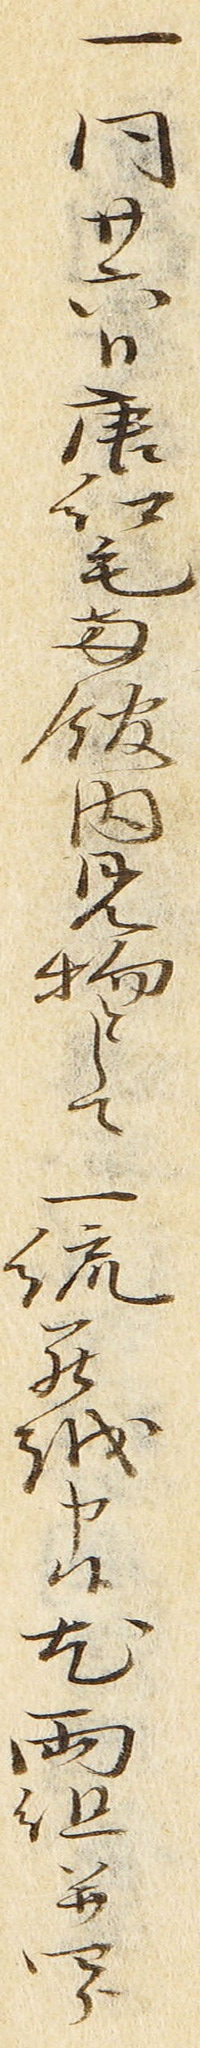一同廿六日唐紅毛両館内見物として一統罷越申候両組並四分
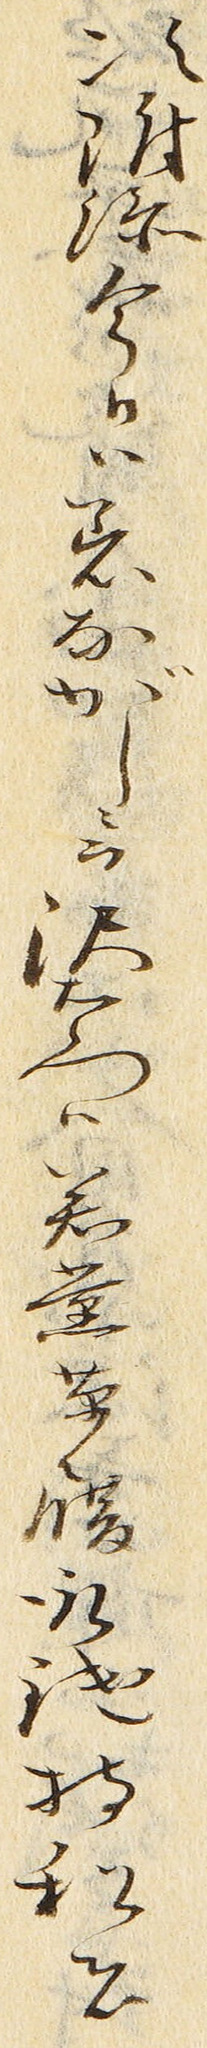次附添今日は着ながしに而沢右衛門は若党草履取鑓持私は
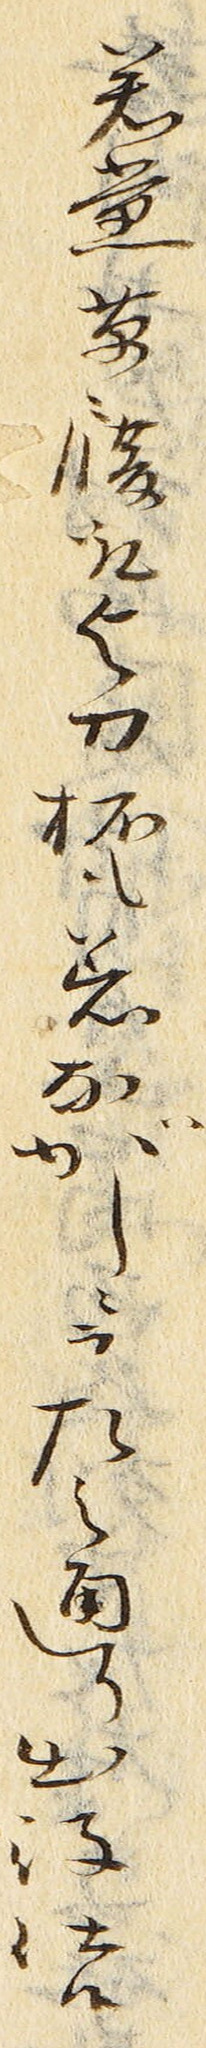若党草履取と刀杯もきな着ながしに而左之通り出役仕候
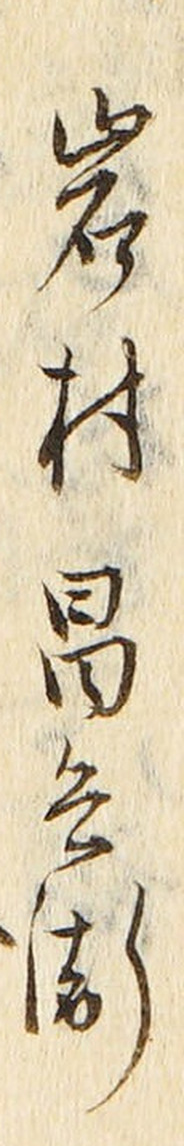岩村昌兵衛
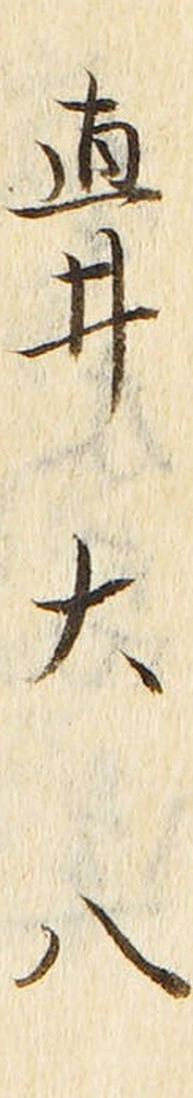直井大八
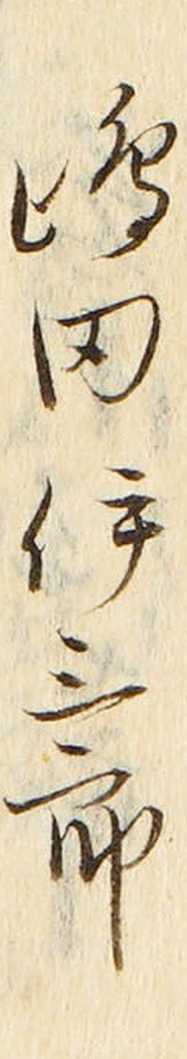嶋田伊三郎
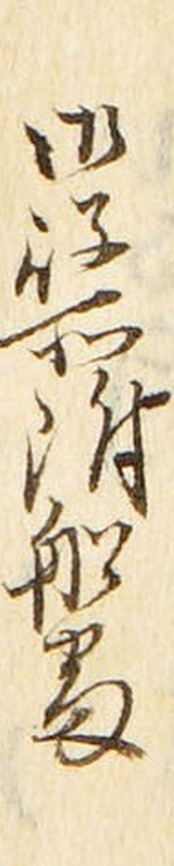御役所附船處
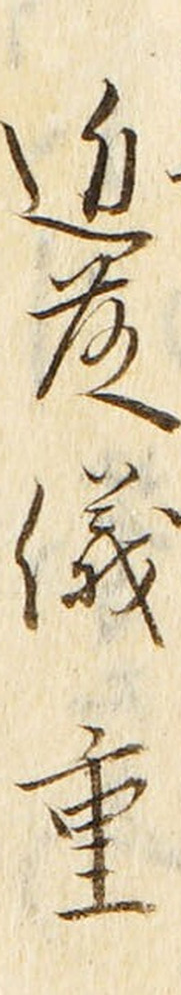近藤儀重
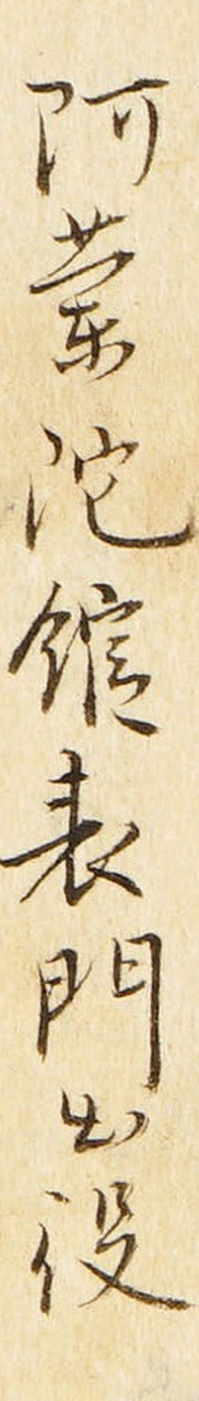阿蘭陀館表門出役
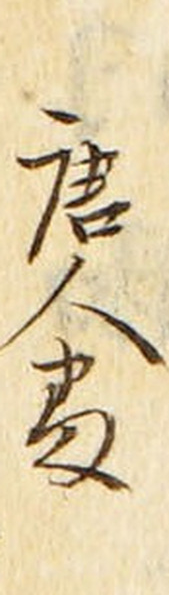唐人處
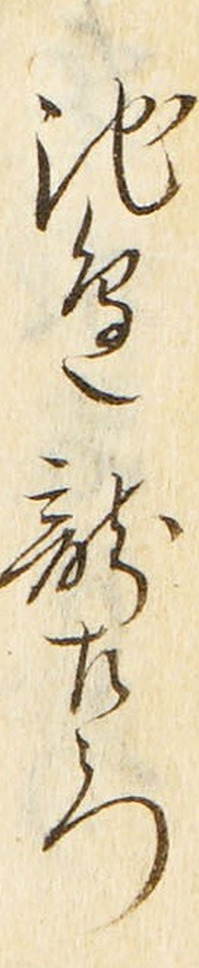池辺龍左衛門
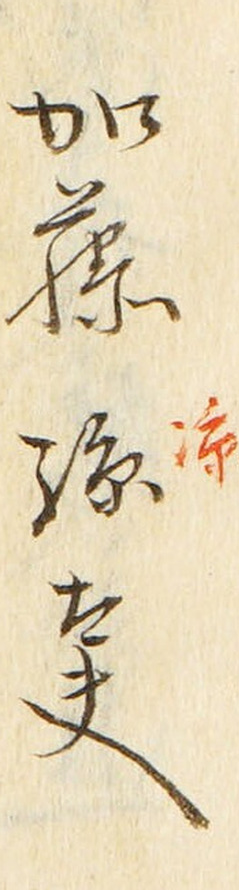加藤孫太夫
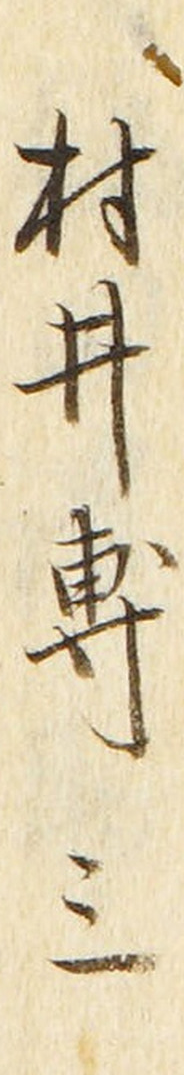村井専三

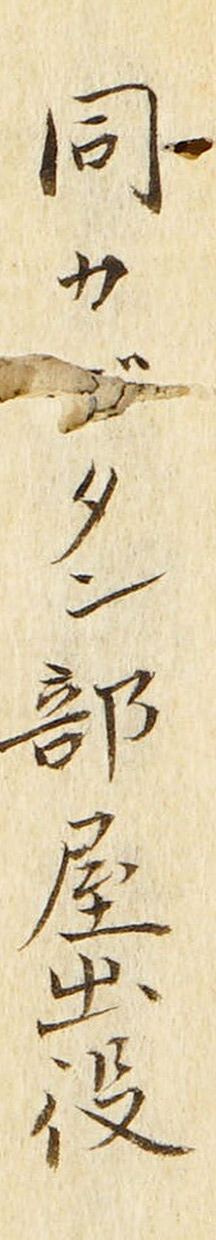同カ？タン部屋出役
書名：長崎漂流記
